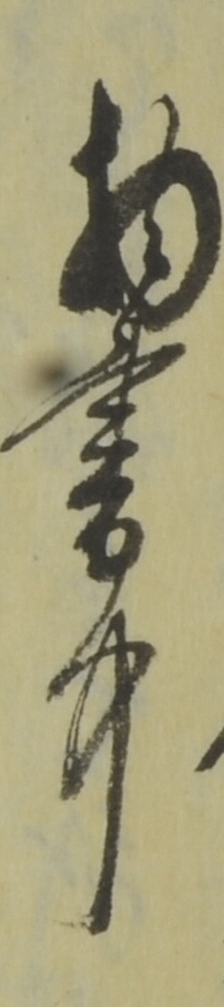物書中

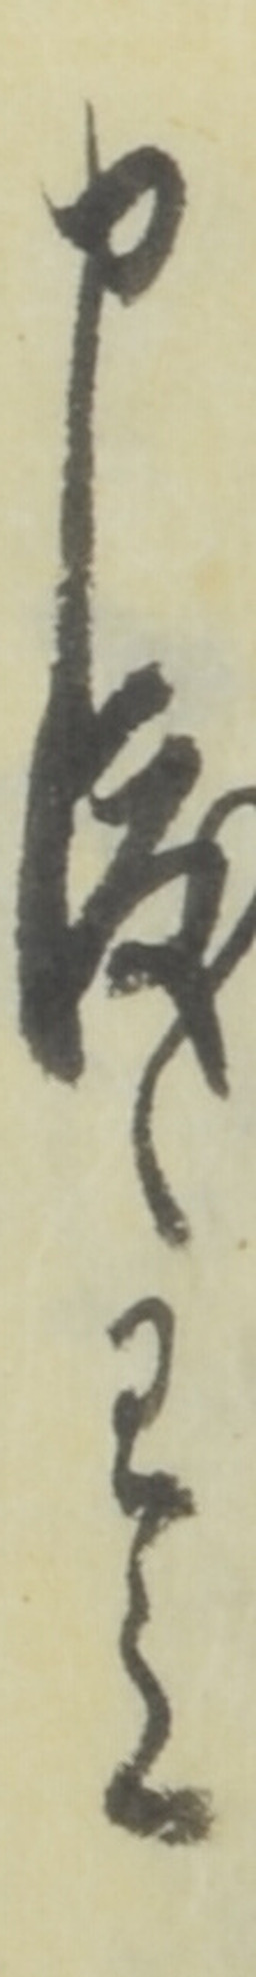申渡候已上
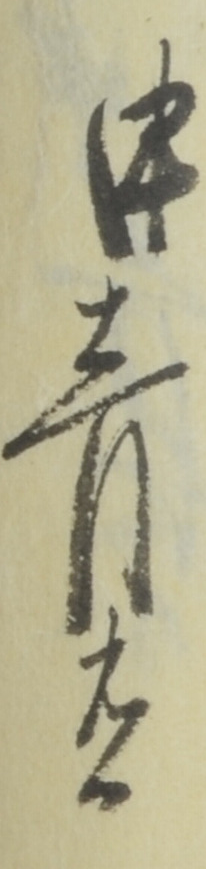申十二月廿日
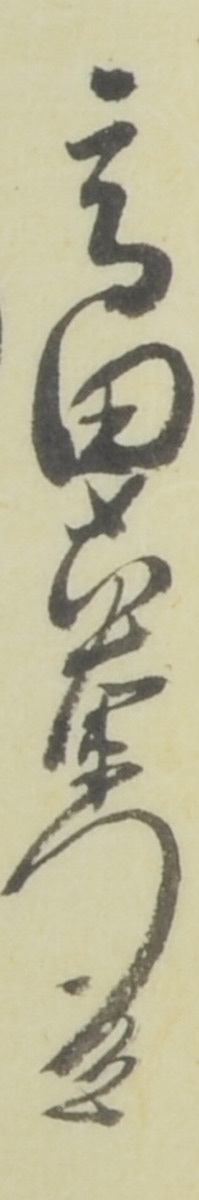高田六右衛門殿
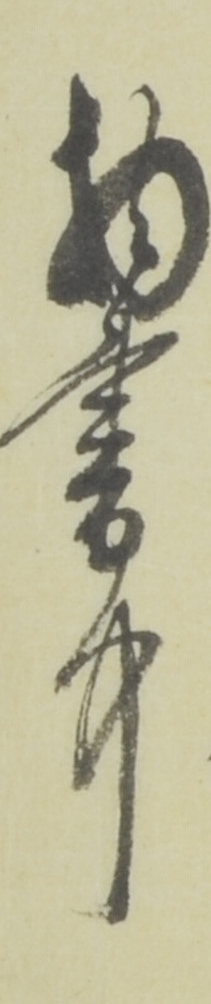物書中
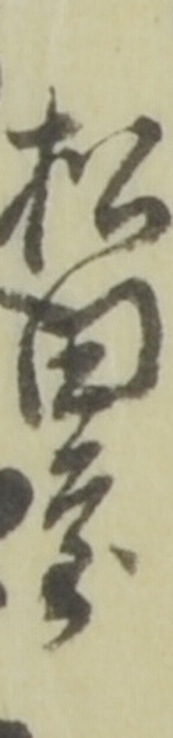松田屋
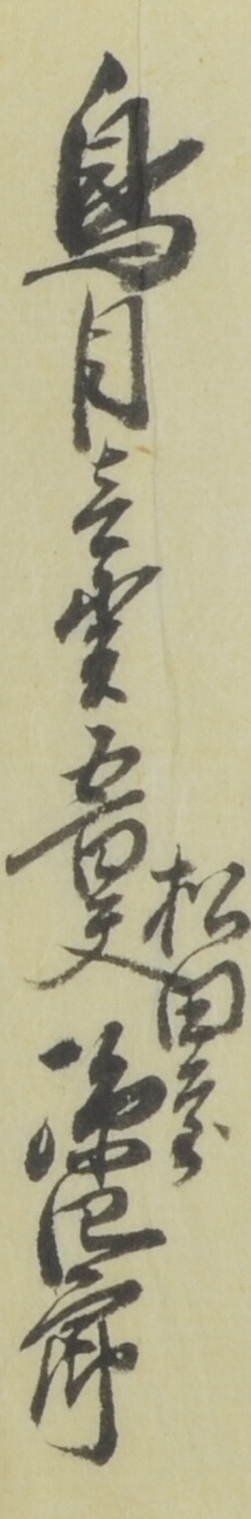鳥目壱貫五百文孫四郎
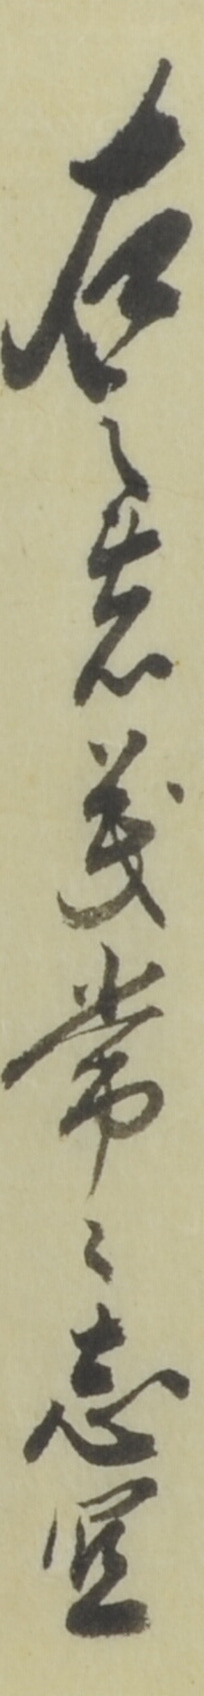右之者義常々志宜
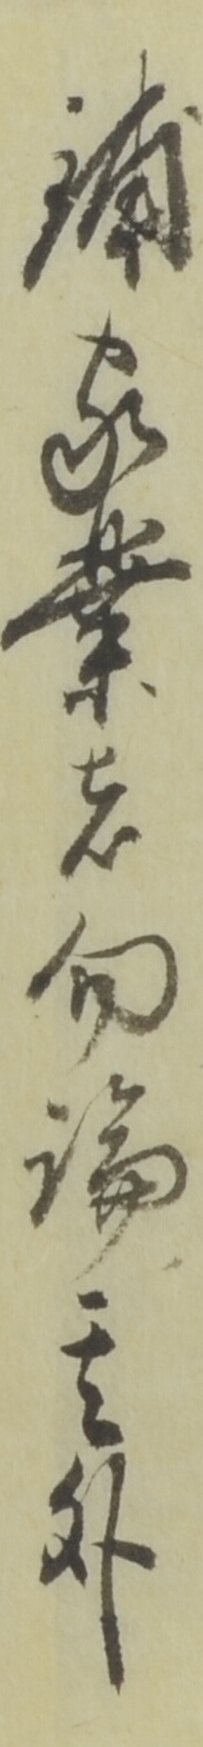鋪家業は勿論其外
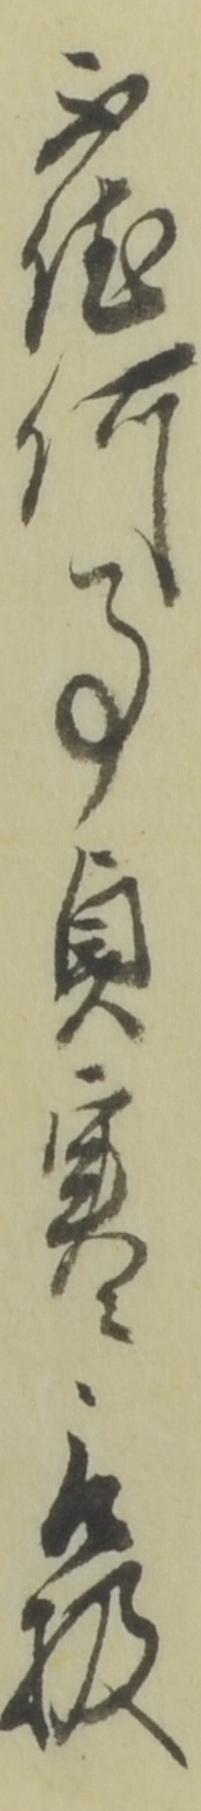不依何事貞実ニ取扱
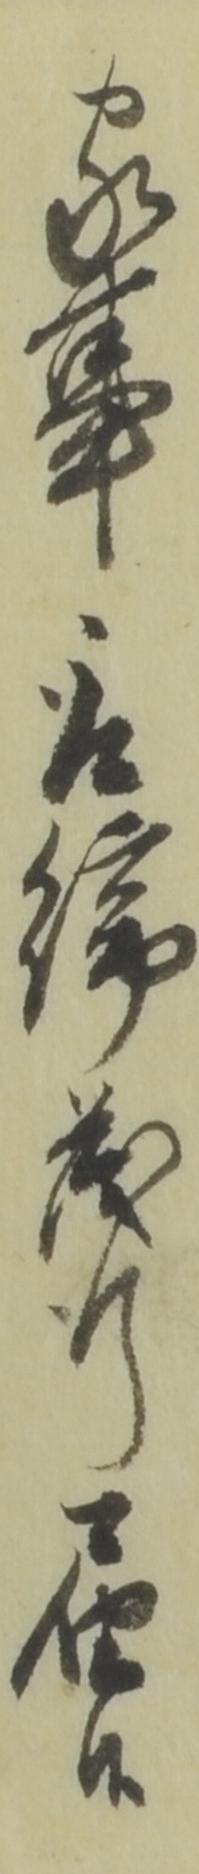家事取締も行届候
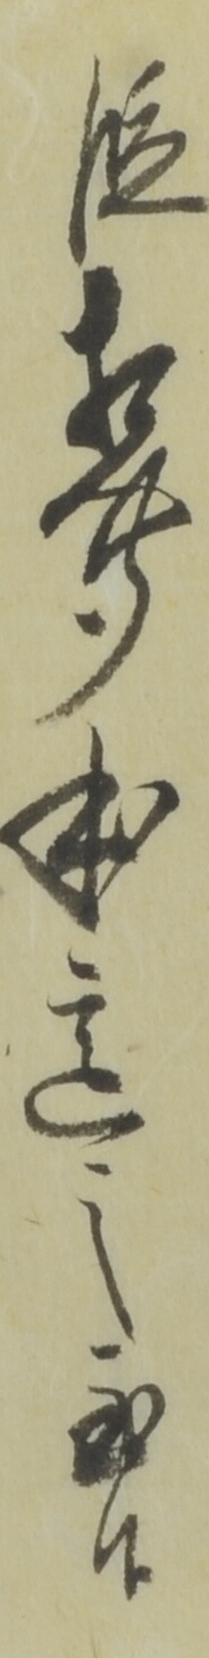段相聞本意之至候
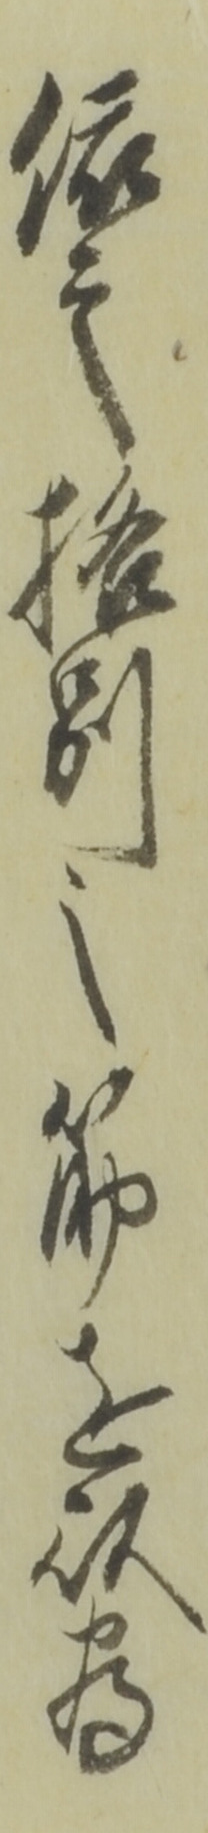依之格別之筋を以為
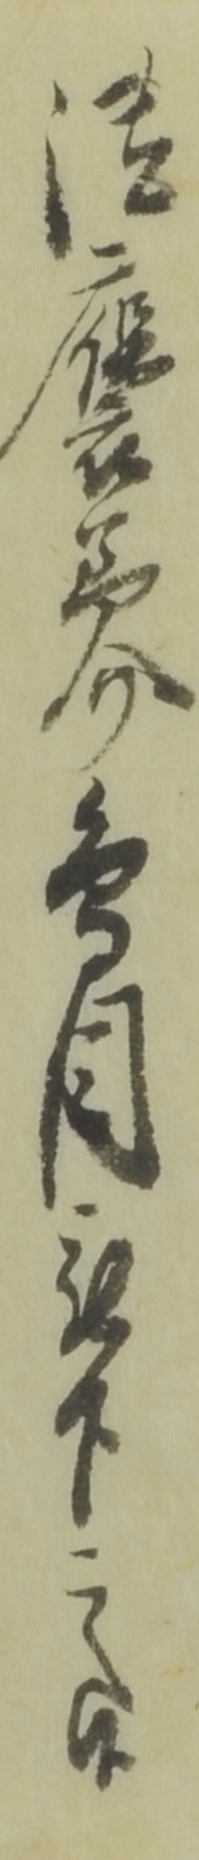御褒美鳥目被下之候
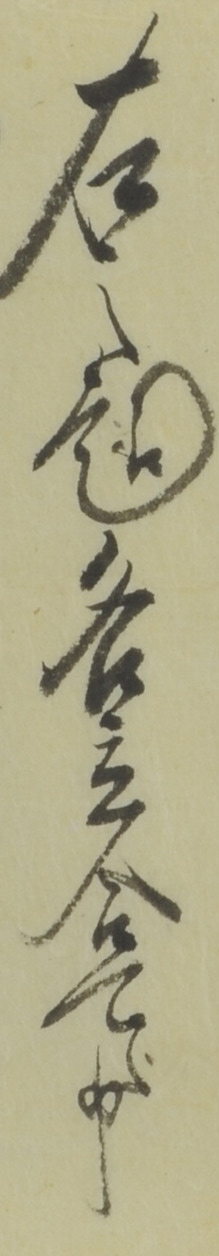右之趣各立合可被
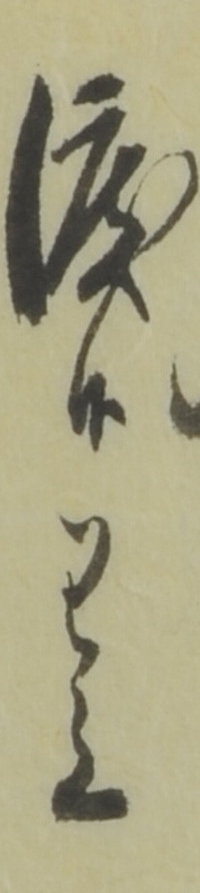渡候已上
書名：御触書御書附控
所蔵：伊那市立高遠町図書館・合同会社AMANE
